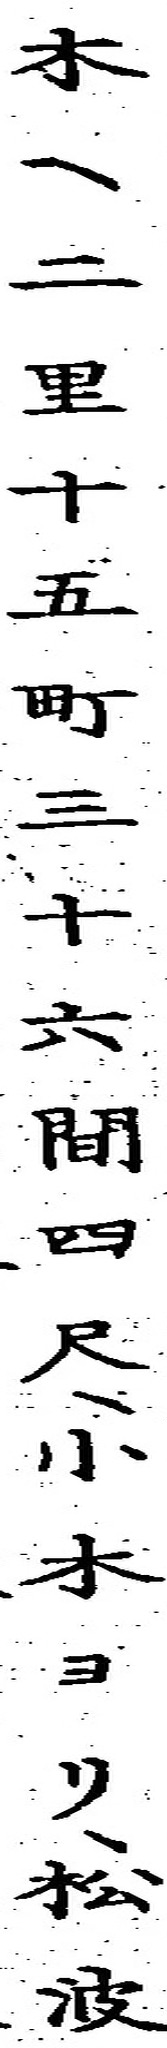木ヘ二里十五町三十六間四尺、小木ヨリ、松波
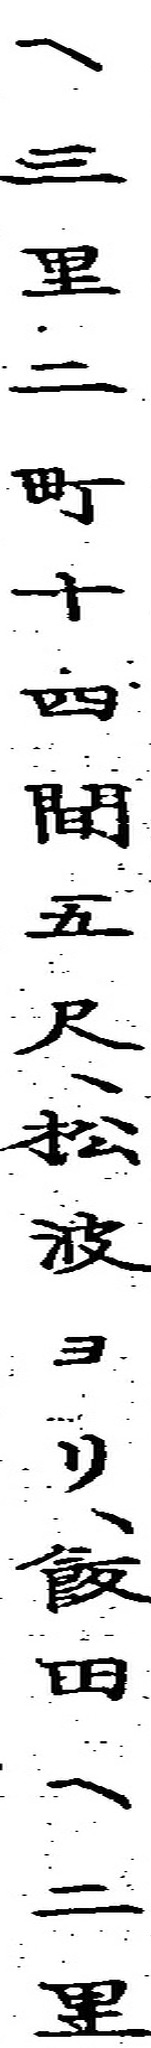ヘ三里二町十四間五尺、松波ヨリ、飯田ヘ二里
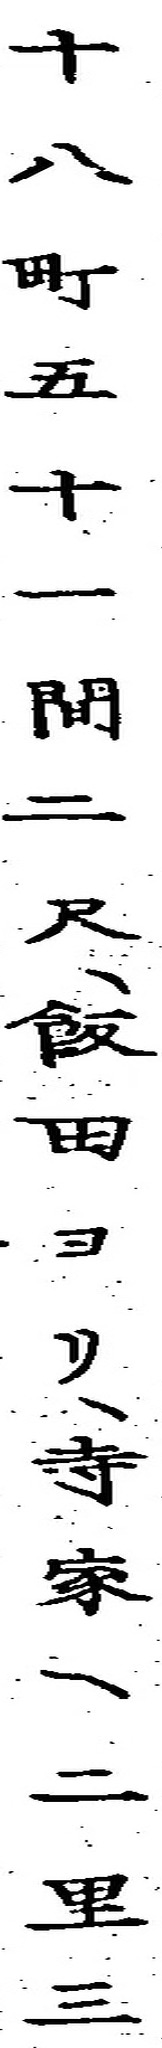十八町五十一間二尺、飯田ヨリ、寺家ヘ二里三
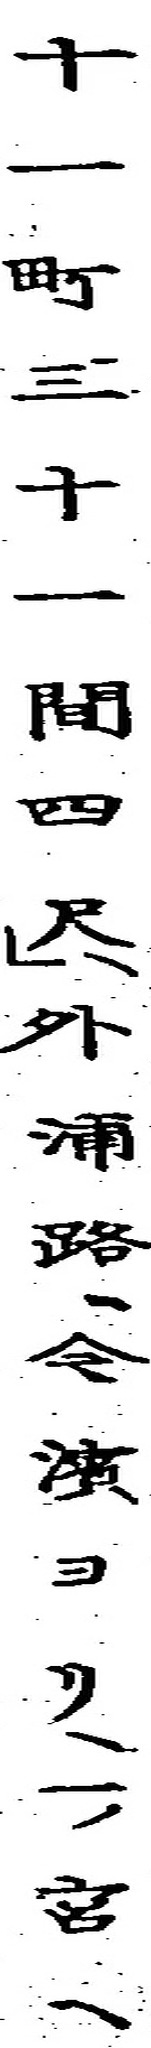十一町三十一間四尺」、外浦路、今浜ヨリ、一宮ヘ
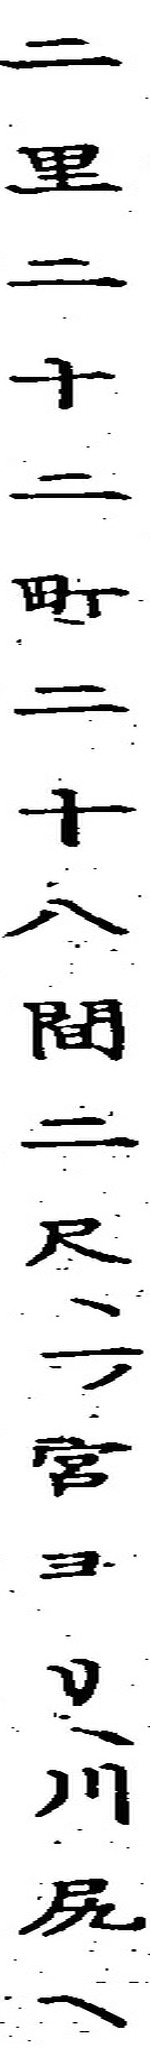二里二十二町二十八間二尺、一宮ヨリ、川尻ヘ
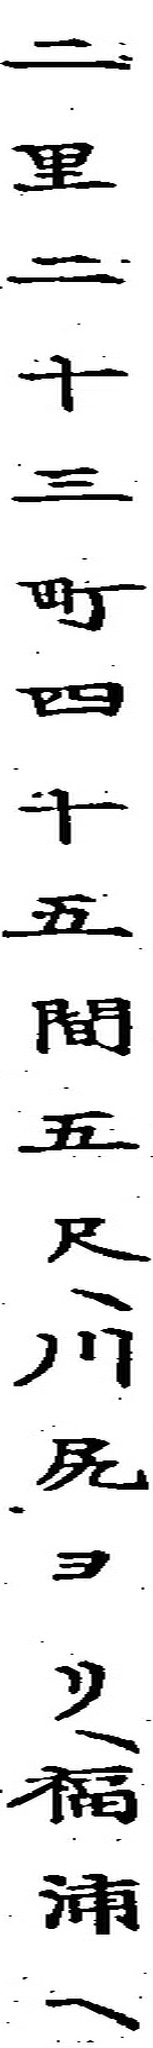二里二十三町四十五間五尺、川尻ヨリ、福浦ヘ
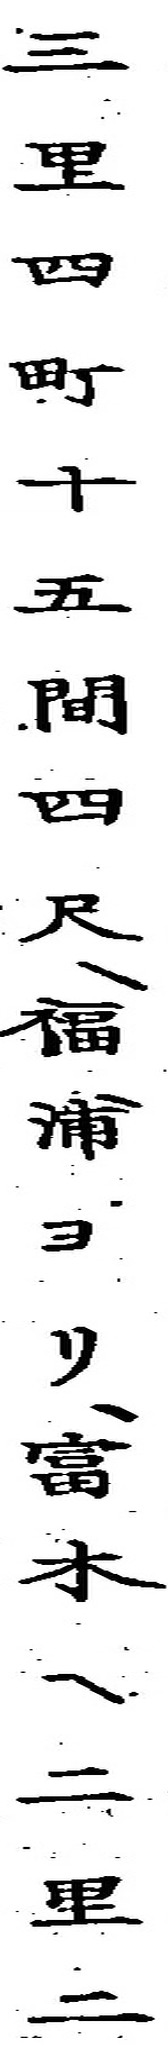三里四町十五間四尺、福浦ヨリ、富木ヘ二里二
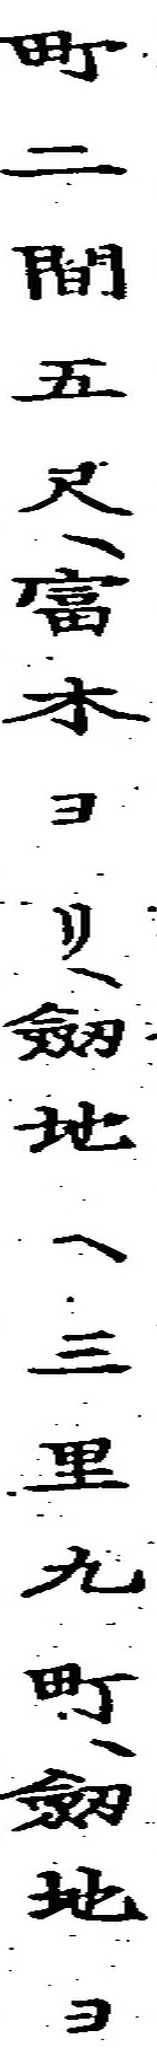町二間五尺、富木ヨリ、劔地ヘ三里九町、劔地ヨ
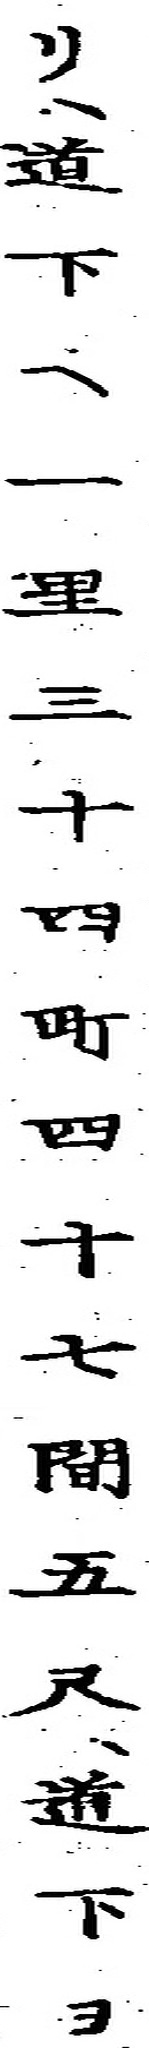リ、道下ヘ一里三十四町四十七間五尺、道下ヨ
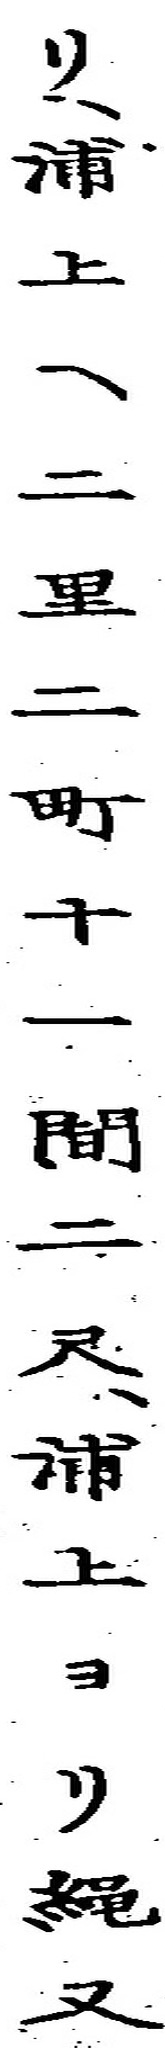リ、浦上ヘ二里二町十一間二尺、浦上ヨリ縄又
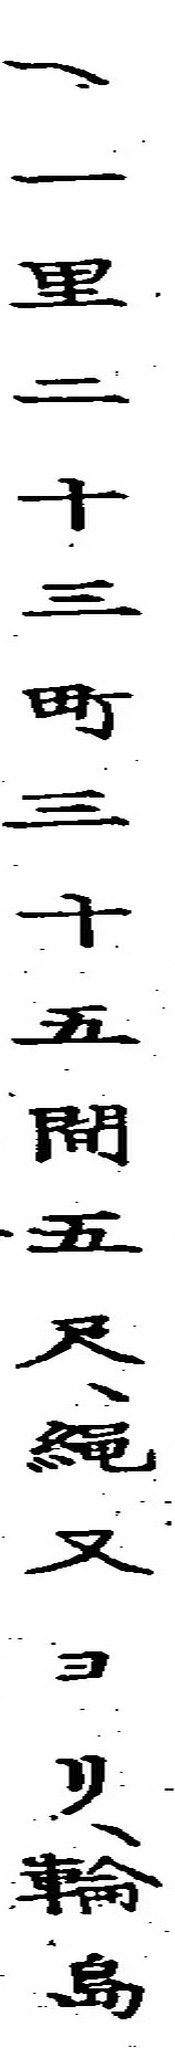ヘ一里二十三町三十五間五尺、縄又ヨリ、輪島
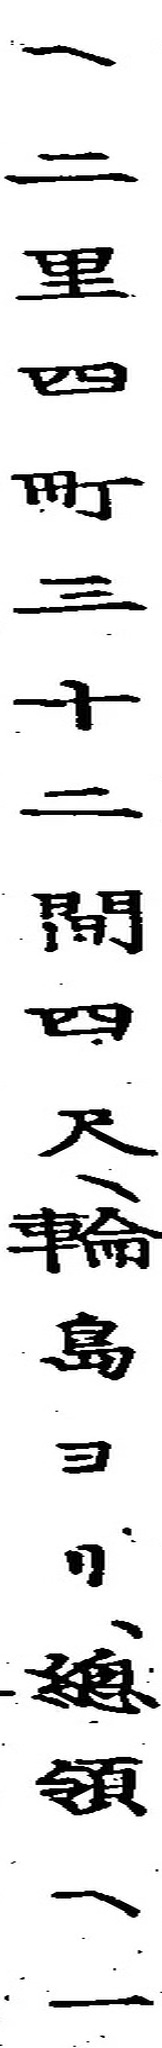ヘ二里四町三十二間四尺、輪島ヨリ、総領ヘ一
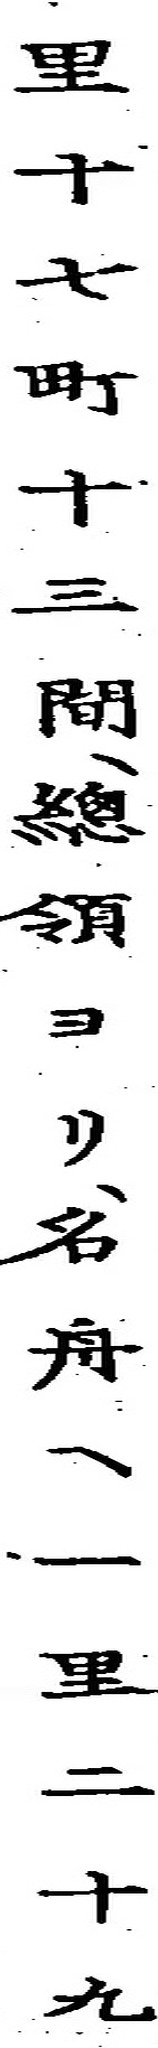里十七町十三間、総領ヨリ、名舟ヘ一里二十九
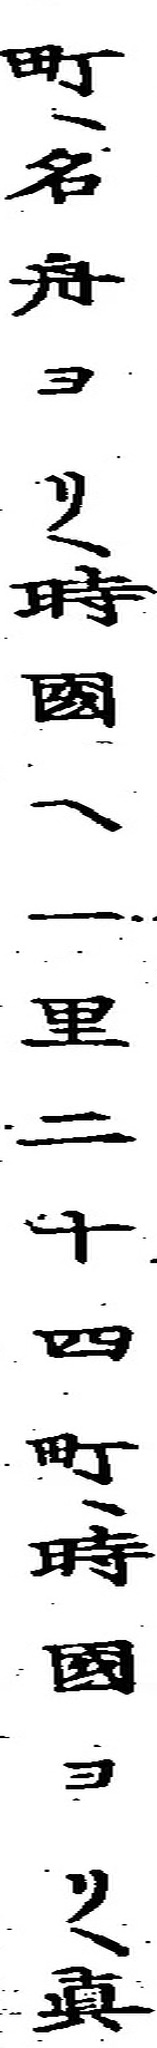町、名舟ヨリ、時国ヘ一里二十四町、時国ヨリ、真
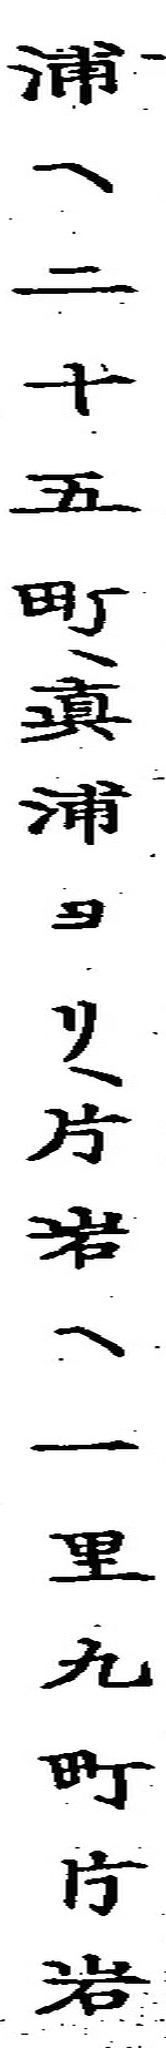浦ヘ二十五町、真浦ヨリ、片岩ヘ一里九町片岩

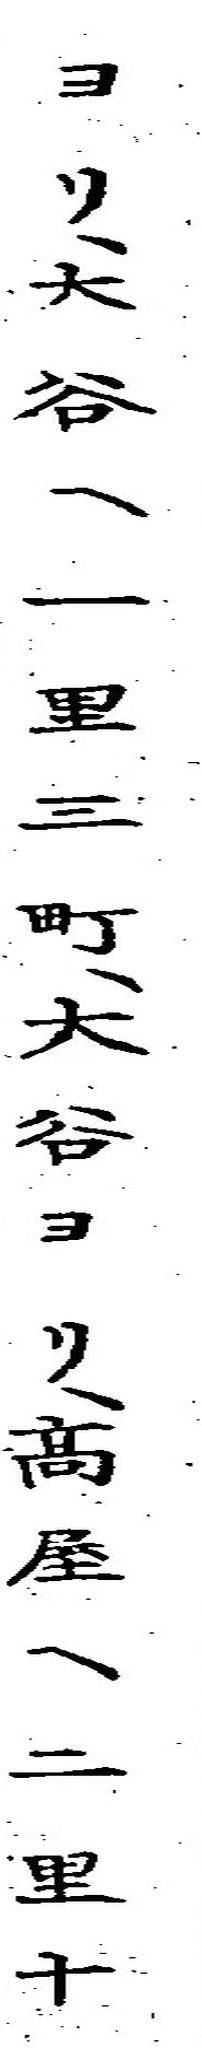ヨリ、大谷ヘ一里三町、大谷ヨリ、高屋ヘ二里十
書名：能登地誌略
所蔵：国立国会図書館 National Diet Library, JAPAN
